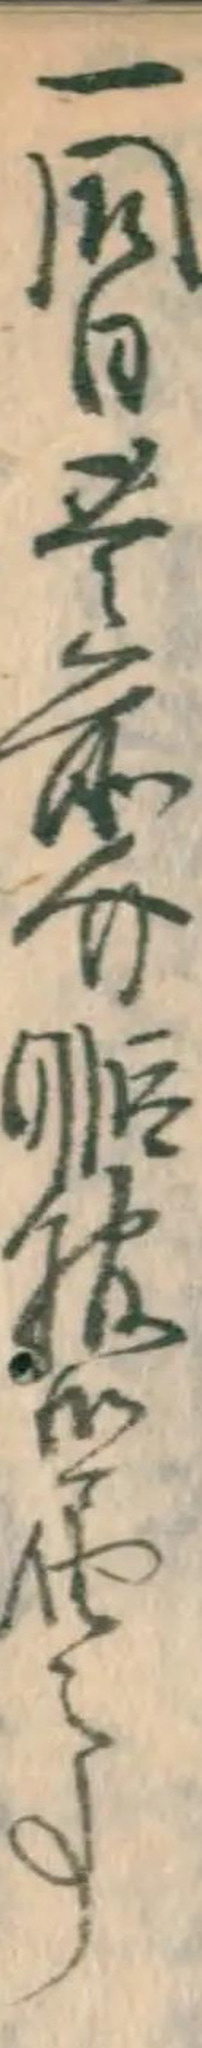一同日豊前介暇服御届之事
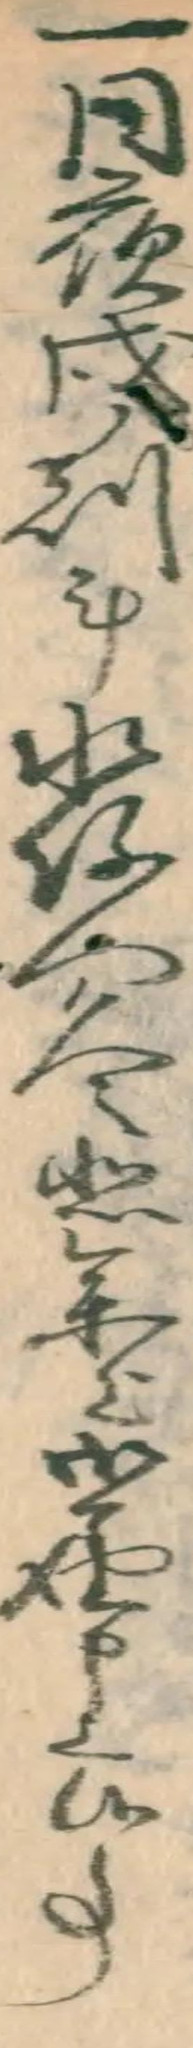一同夜戌ノ刻計水役人久之丞参上御届申上候事
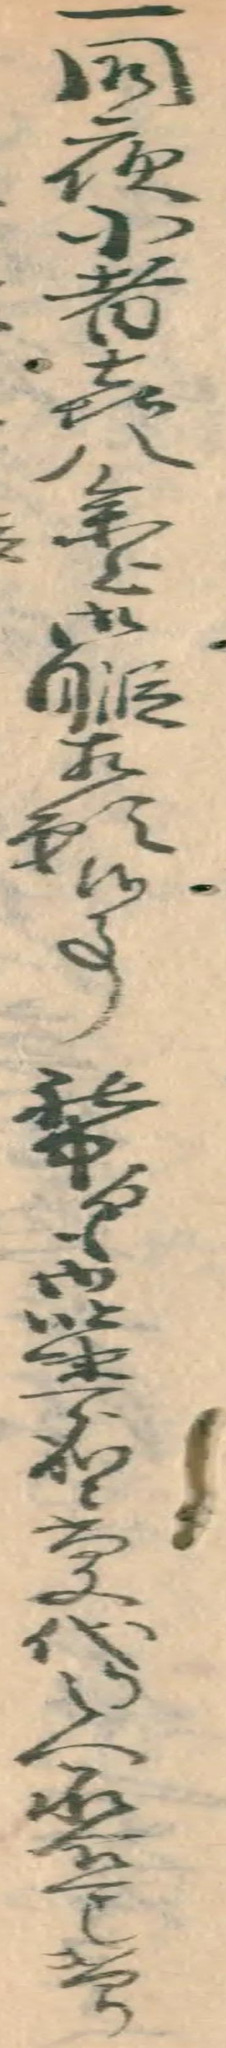一同夜小者喜八参上御暇相願候事社中ゟも御吟味可被成候尚又代り之人承合可申候替り
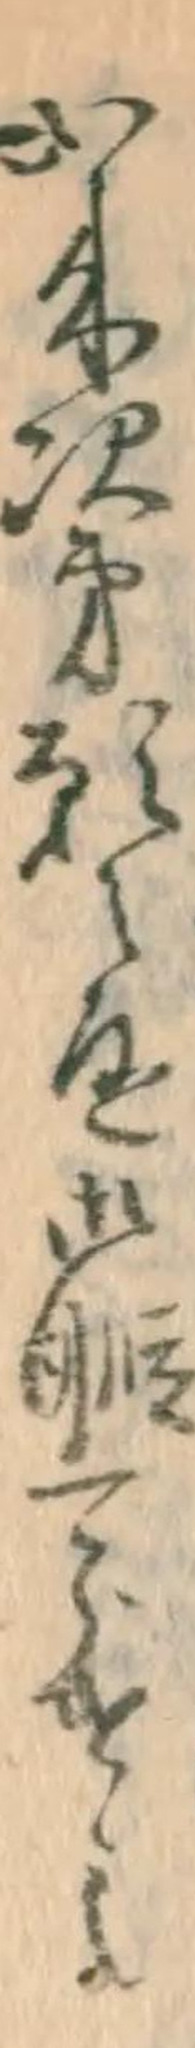出来次第願之通御暇可被遣候也
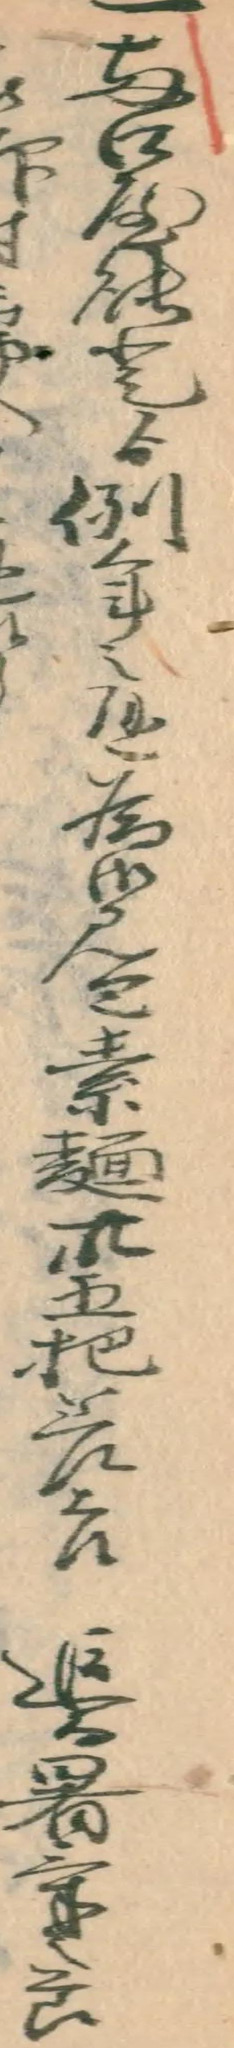一両口屋能登ゟ例年之通為御見廻素麺廿五把差上候追而暑気之節
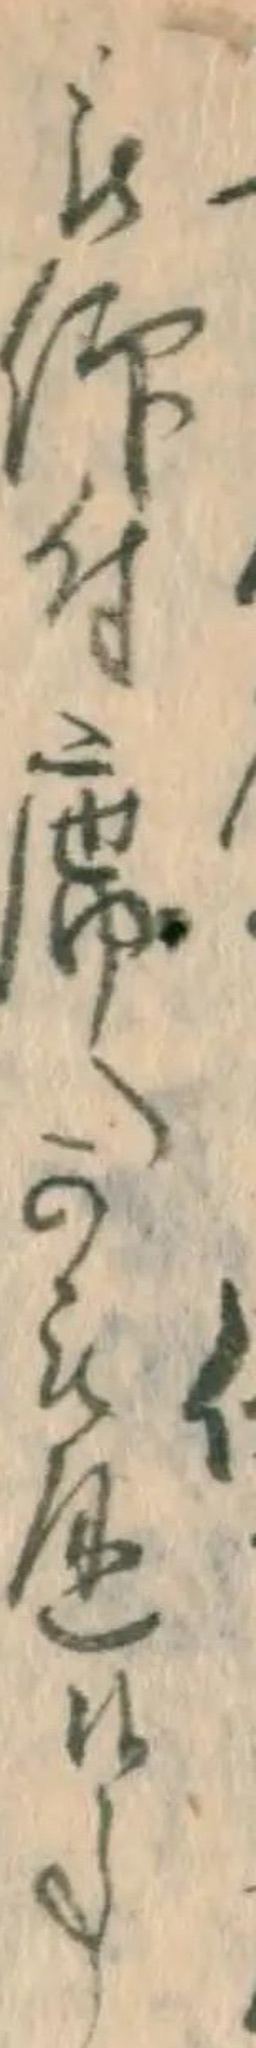被仰付席へ可被通候事
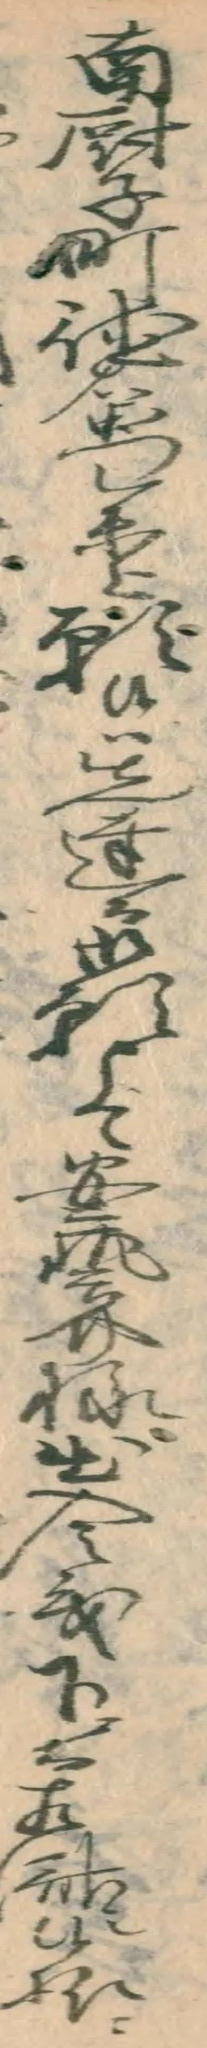一南厨子町徳右衛門参上願候ハ先達而御願申上候安芸介様へ出入之義下ニ而相済シ候様ニ
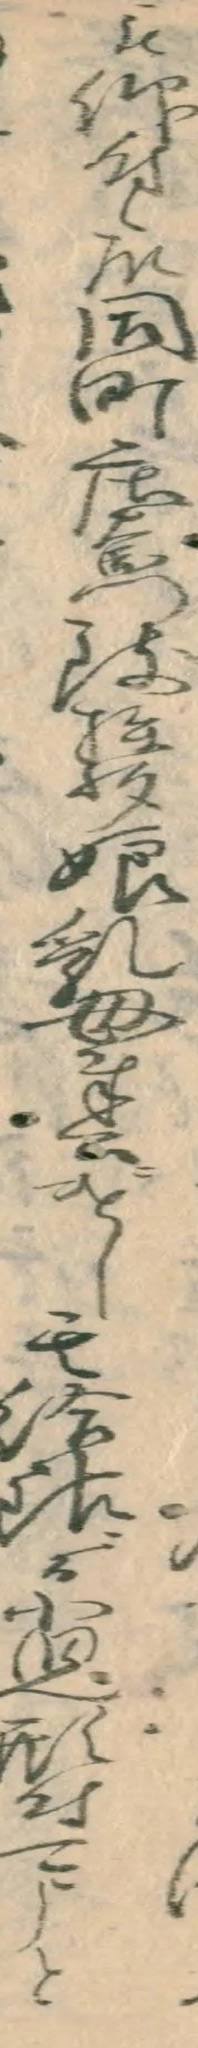被仰付候故同町庄右衛門致挨拶娘乳母奉公ニ遣し其給銀ニ而小児形付可申と
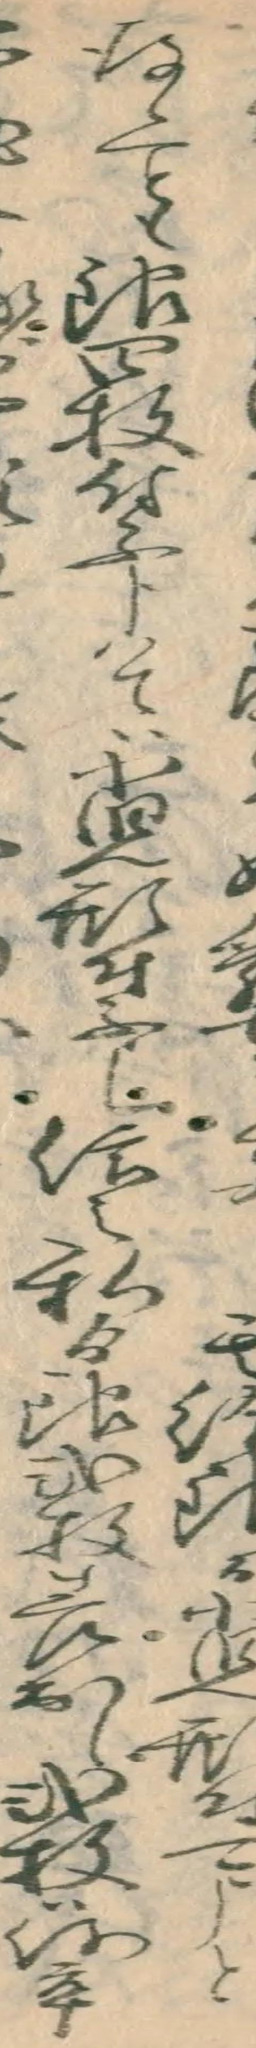存候へとも銀四枚付不申候てハ小児形付不申候依之私ゟ銀弐枚差出し弐枚ハ何卒
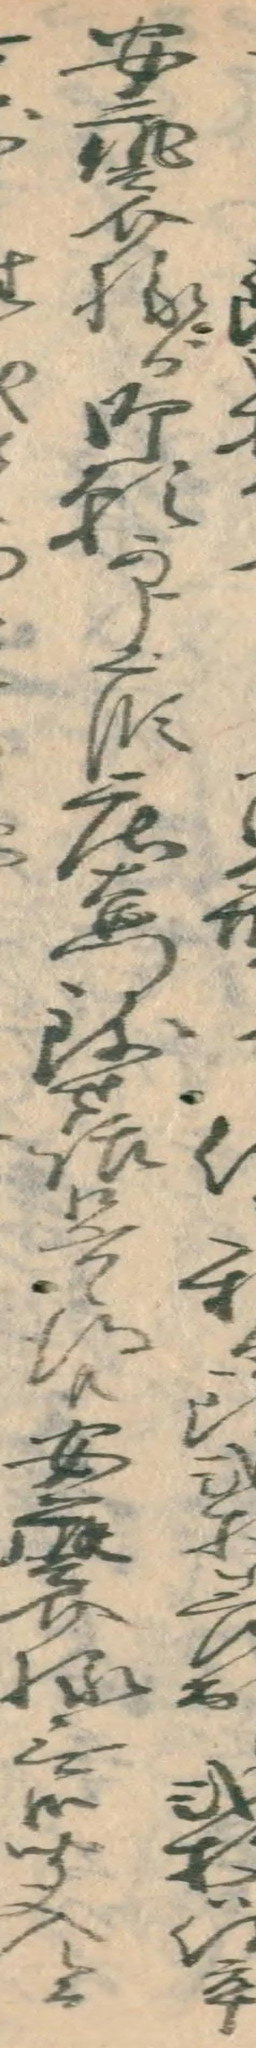安芸介様ゟ御願可申上段庄右衛門致世話呉候得共安芸介様無御聞入候而
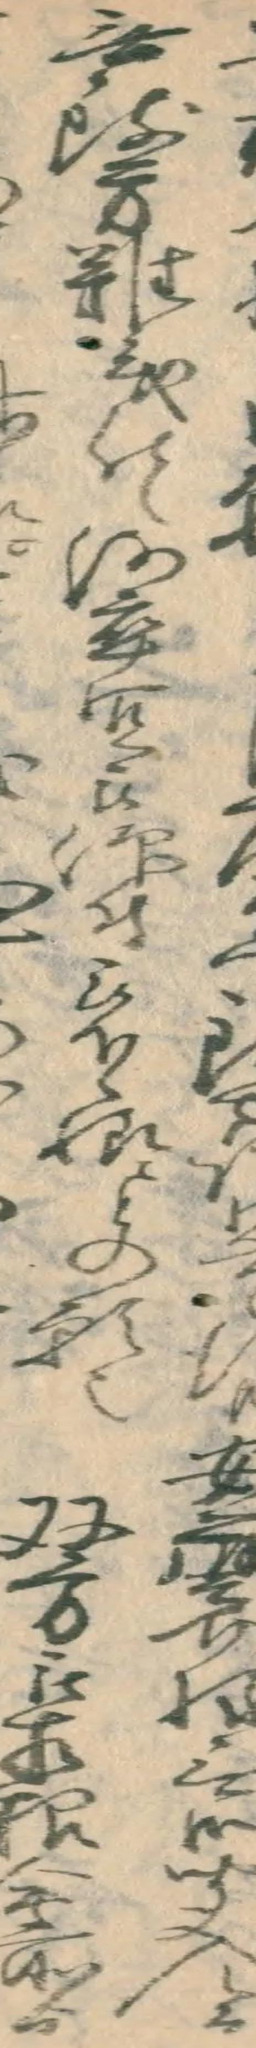無致方難義仕候何卒宜被仰付被下候様ニとの願也双方被相招会所ゟ
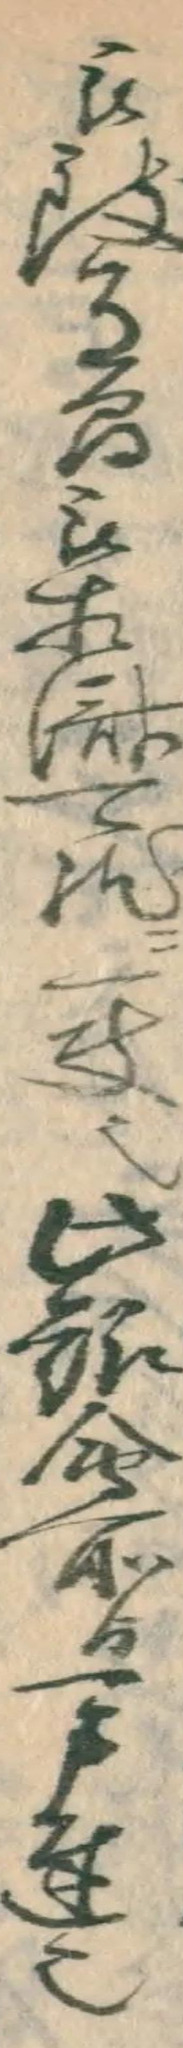被致了簡被相済可然ニ一決也此趣会所ゟ可申達也
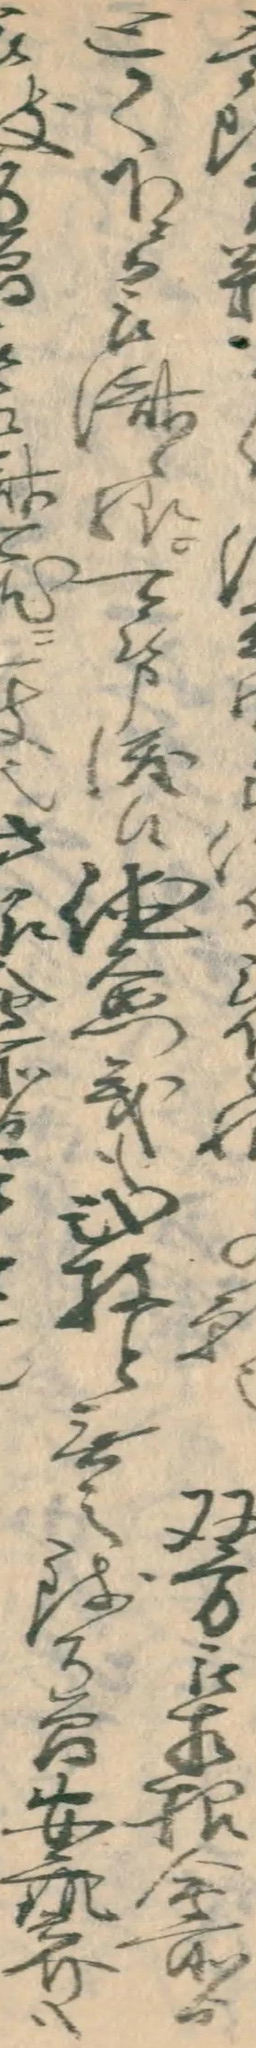とかく下ニ而被済候様ニ可被申渡候徳右衛門義も弐枚と無之致了簡安芸介も
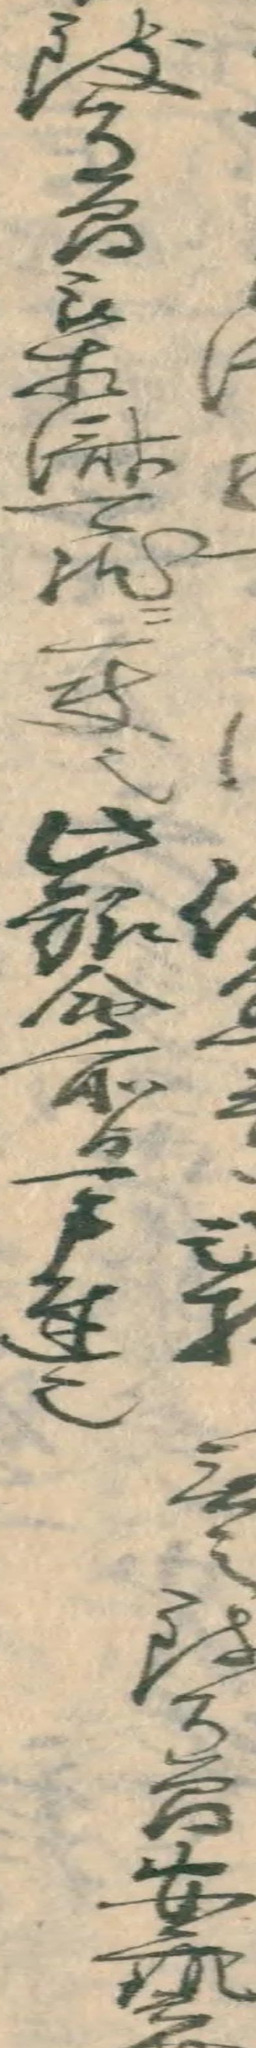被致了簡被相済可然ニ一決也此趣会所ゟ可申達也
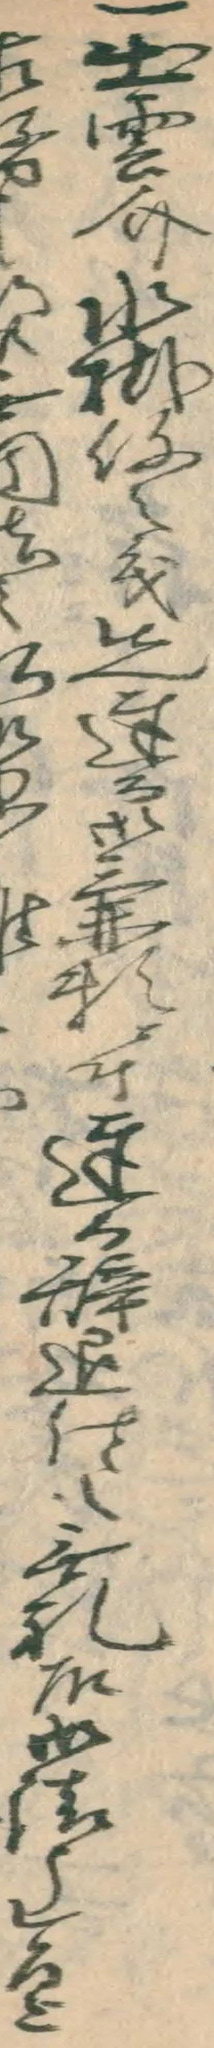一出雲介水掛役之義先達而御兼頼ニ付達而辞退仕候も無礼故御請申候今日迄
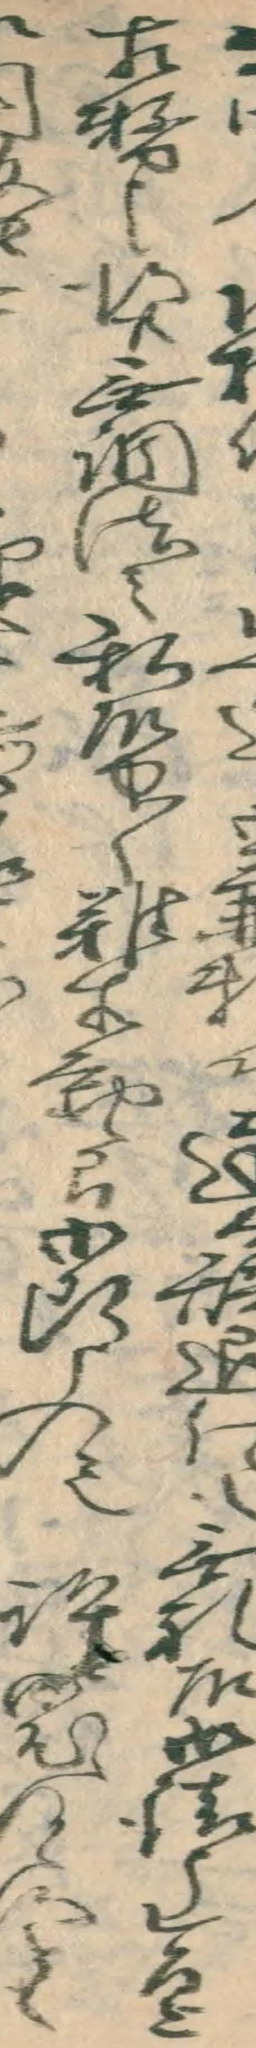相務申候得共無調法之私故中〳〵難相勤候間御断申入候也評ニ御尤ニ存候得とも
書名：賀茂社記録. 第58冊
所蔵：国立国会図書館 National Diet Library, JAPAN
